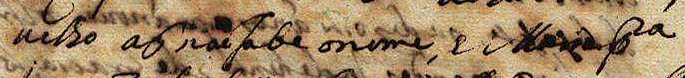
uelho a q̄ naõ sabe o nome, E Maria pra
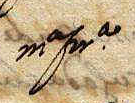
ma pr.a
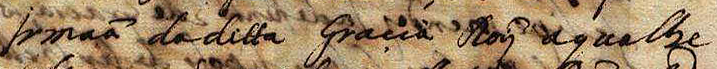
jrmaā da ditta Gracia Roiz̄ a qual he
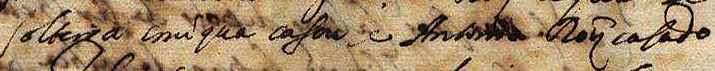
solteira e nūqua casou e Antonio Roiz̄ casado
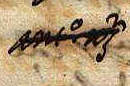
anto roz̄
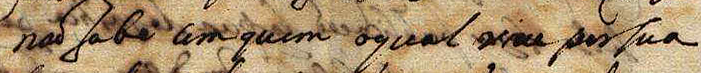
naõ sabe com quem o qual viue por sua
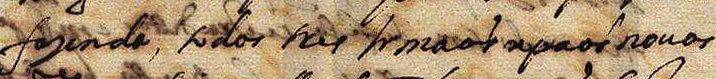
fazenda, todos tres Jrmaõs xpaõs nouos
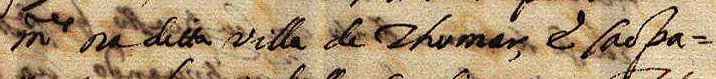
mes na ditta villa de Thomar, e saõ pa
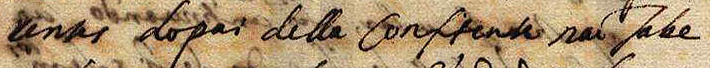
rentes do pai della Confitente naõ sabe
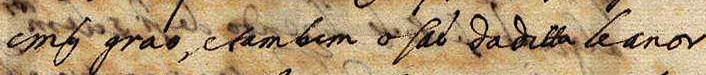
em q̄ grao, e tambem o saõ da ditta Leanor
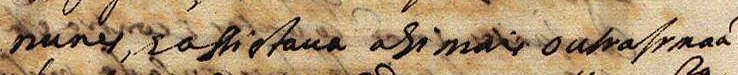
nunes, E assi estaua ahi mais outra Jrmaā
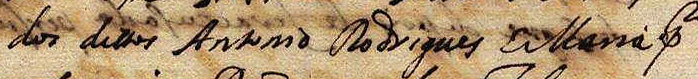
dos dittos Antonio Rodrigues E Maria pra
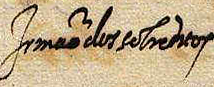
Jrmaõ dos sobreditos
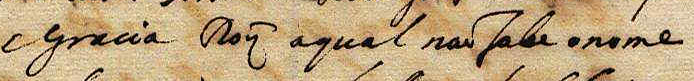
e Gracia Roīz a qual naõ sabe o nome
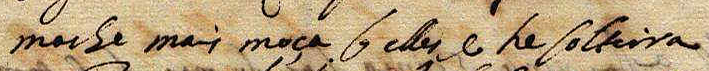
mas he mais moça q̄ elles e he solteira
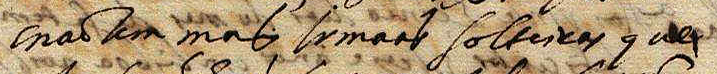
o naõ tem mais Irmaãs solteiras que
